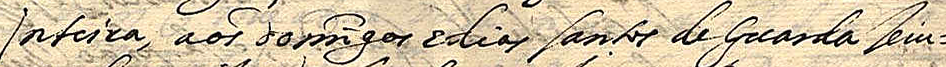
Jnteira, aos domīgos E dias santos de Guarda Jeiu
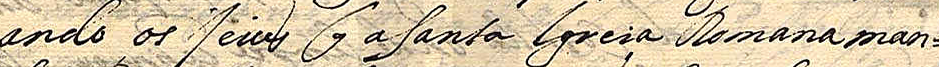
ando os Jeiūs q̄ a Santa Igreia Romana man
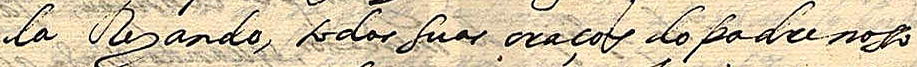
da Rezando, todas suas oraçoĩs do padre nosso
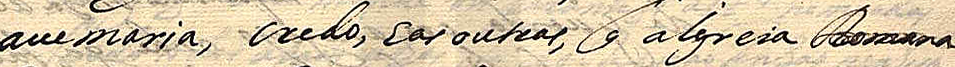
aue maria, credo, E as outras, q̄ a Igreia Romana
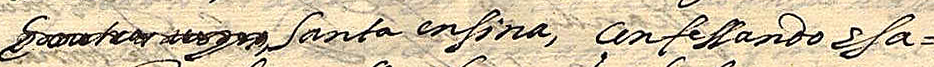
E outras uezes, Santa ensina, confessando E sa
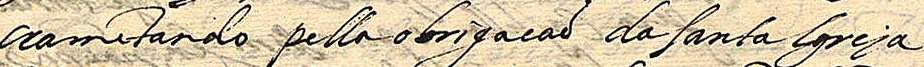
cramētando pella obrigacaõ da Santa Igreja
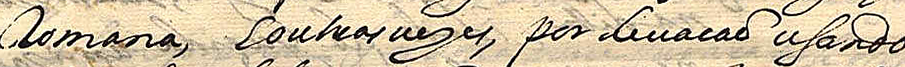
Romana, E outras uezes, por deuacaõ usando
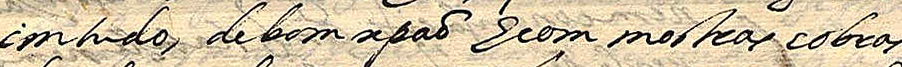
em tudo, de bom xpaõ E com mostras E obras
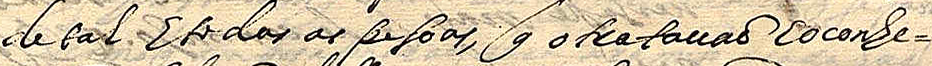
de tal E todas as pesoas, q̄ o tratauaõ E o conhe
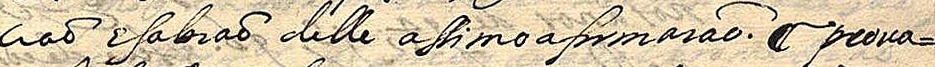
ciaõ E sabiaõ delle assim o afirmaraõ. ¶ proua
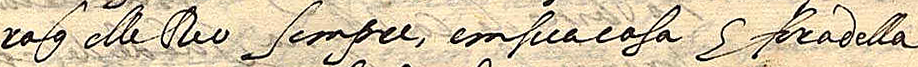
ra q̄ elle Reo sempre, em sua casa E fora della
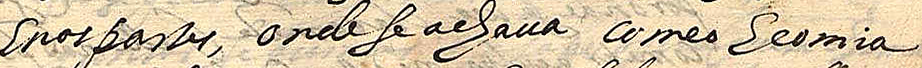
E nas partes, onde se achaua comeo E comia
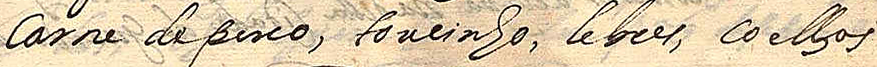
carne de porco, toucinho, lebres, coelhos
